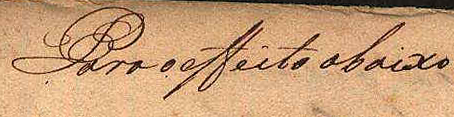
Para o effeito abaixo
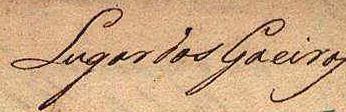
Lugar das Gaeiras
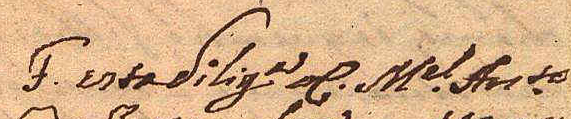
F. esta dilig.a o C. M.el An.to
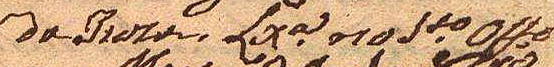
da Roza. Lx.a no S.to Off.o
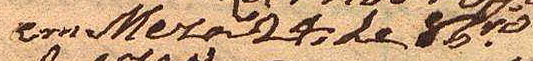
em Meza 24. de 8b.ro
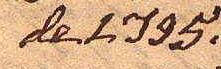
de 1795.
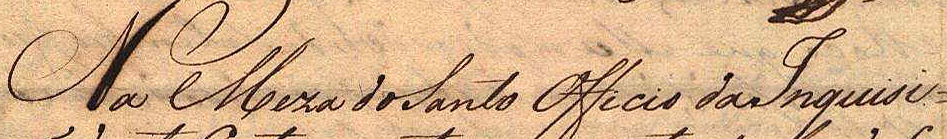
Na Meza do Santo Officio da Inquisi
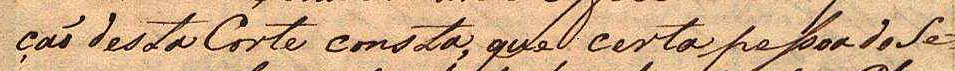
çaõ desta Corte consta, que certa pessoa do se
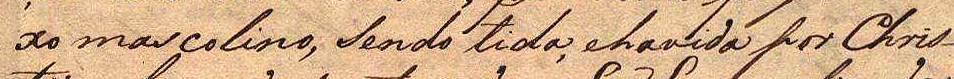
xo mascolino, sendo tida, e havida por Chris
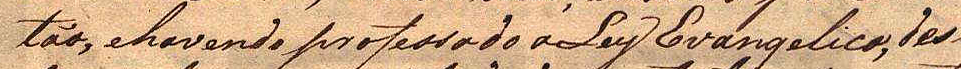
taõ, e havendo professado a Ley Evangelica, des
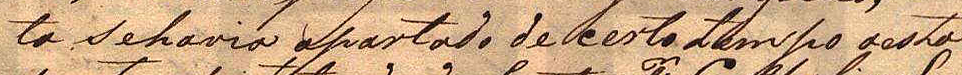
ta se havia apartado de certo tempo a esta
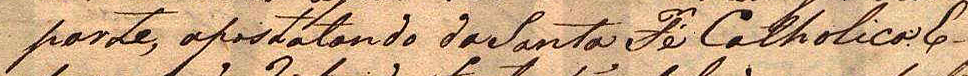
parte, apostatando da Santa Fé Catholica: E
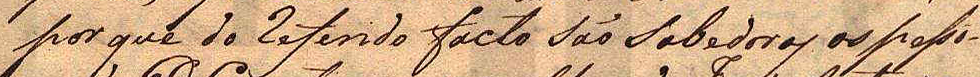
porque do Referido facto saõ sabedoras os pesso
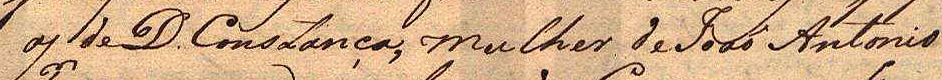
as de D. Constança, mulher de Ioaõ Antonio
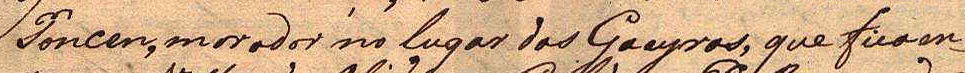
Toncen, morador no lugar das Gaeyras, que fica en
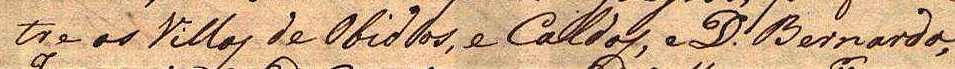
tre as Villas de Obidos, e Calldas, e D. Bernarda,
